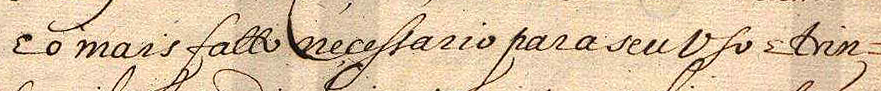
E o mais fatto necessario para seu Vso E trin
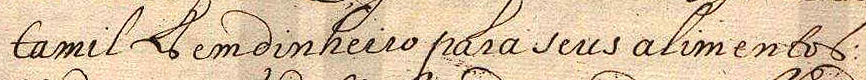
ta mil rs̄ em dinheiro para seus alimentos:
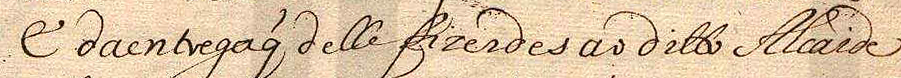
E da entrega q̄ delle fizerdes ao ditto Alcaide
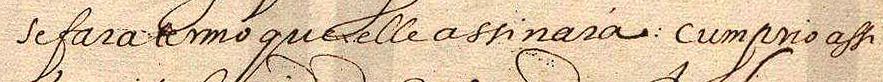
se fara termo que elle assinara: cumprio assi
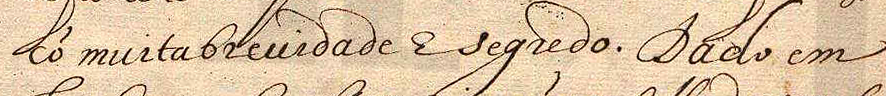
cō muita breuidade E segredo. Dado em
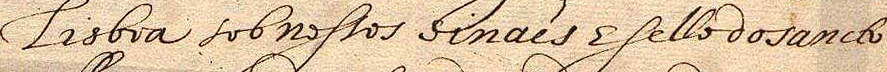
Lisboa sob nossos sinaes E sello do sancto
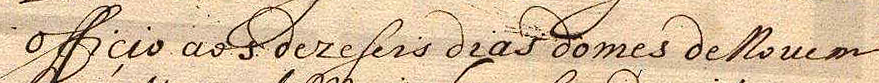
officio aos dezeseis dias do mes de Nouem
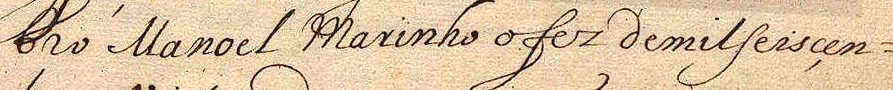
bro Manoel Marinho o fez de mil seiscen
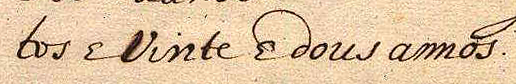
tos E vinte E dous annos.
